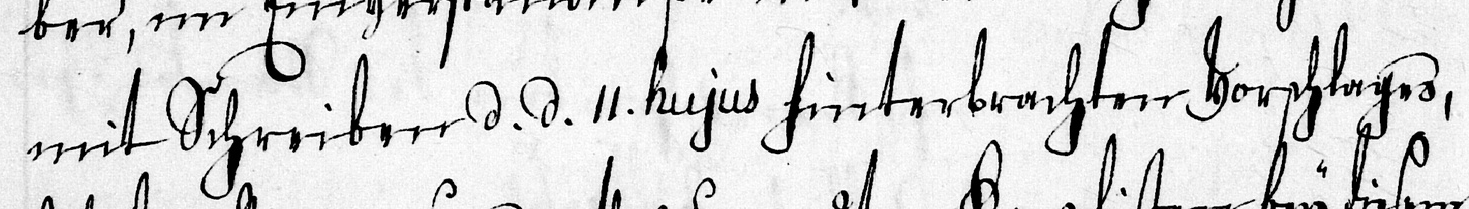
mit Schreiben d. d. 11. hujus hinterbrachten Vorschlages,
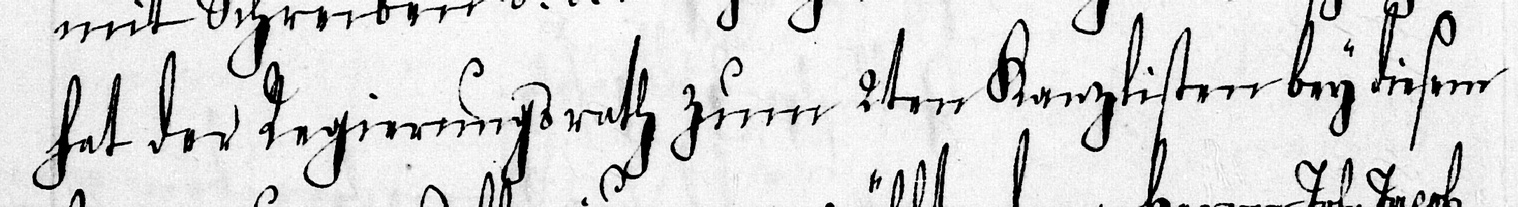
hat der Regierungsrath zum 2ten Kanzlisten bey diesem
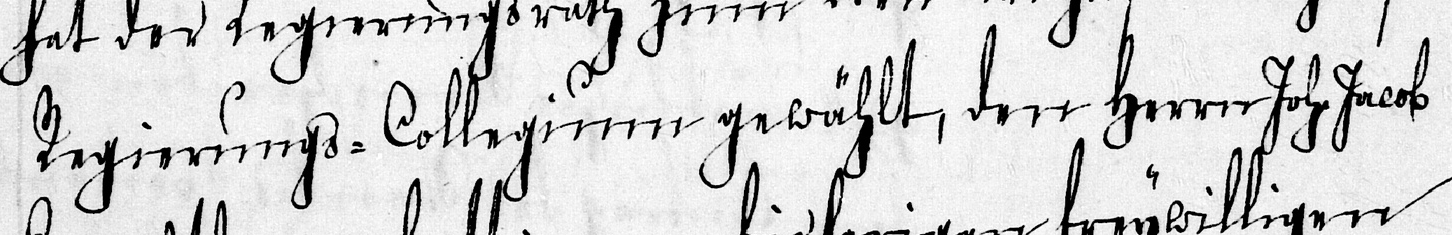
Regierungs-Collegium gewählt, den Herrn Joh. Jacob
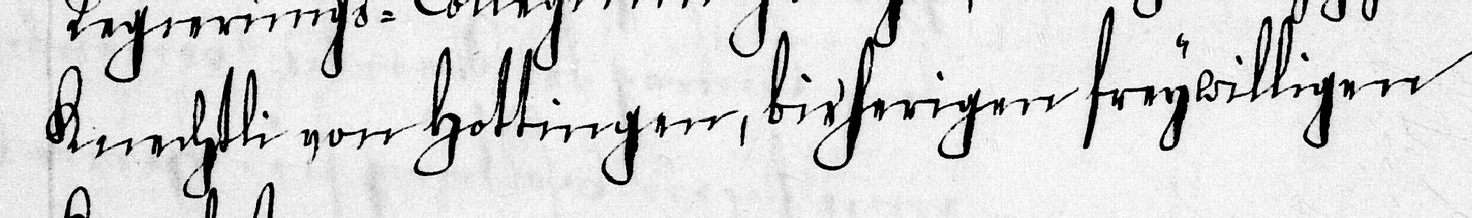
Knechtli von Hottingen, bisherigen freywilligen
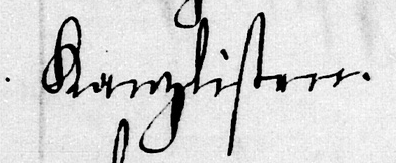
Kanzlisten.
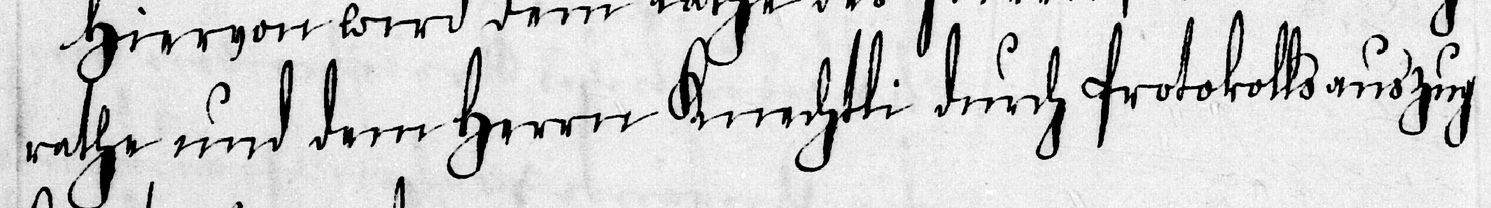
rathe und dem Herrn Knechtli durch Protokollsauszug
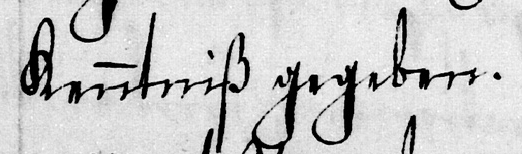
Kenntniß gegeben.
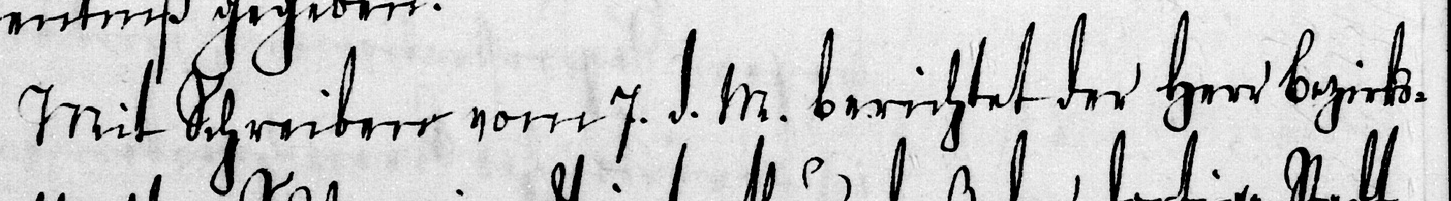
Mit Schreiben vom 7. d. M. berichtet der Herr Bezirks¬
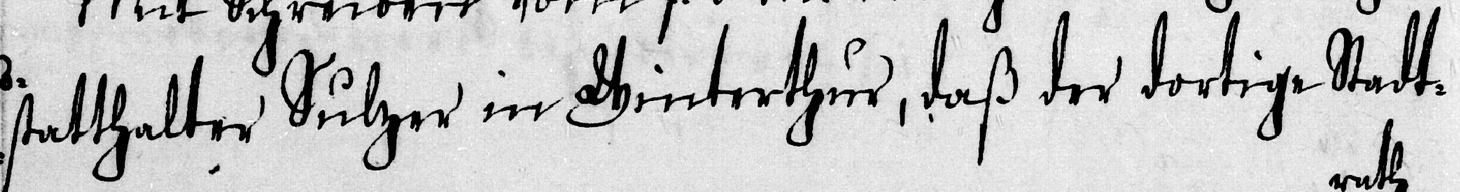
tatthalter Sulzer in Winterthur, daß der dortige Stadt-
